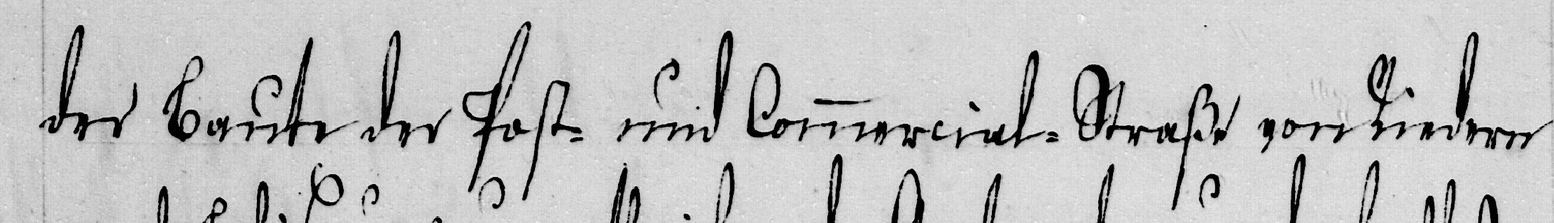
der Baute der Post- und Commercial-Straße von Riedern
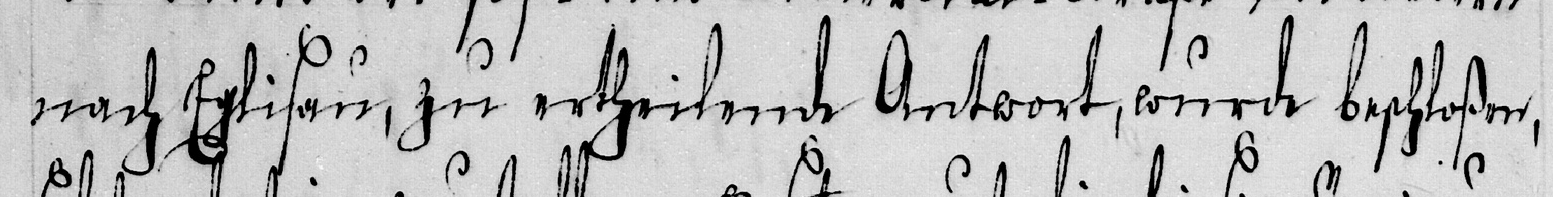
nach Eglisau, zu ertheilende Antwort, wurde beschloße¬
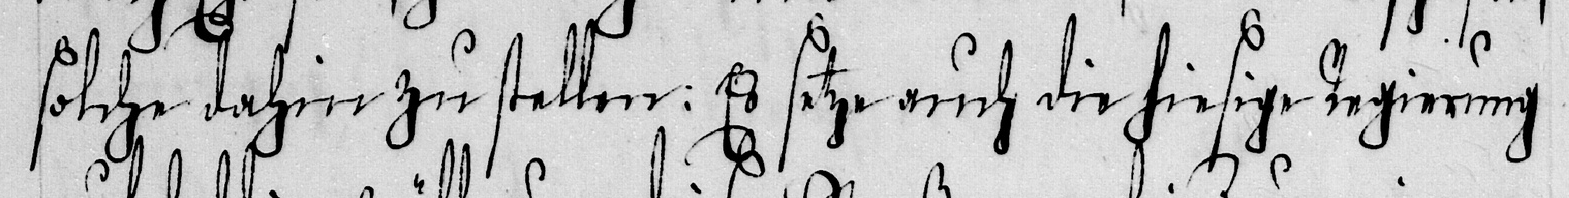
solche dahin zu stellen: Es setze auch die hiesige Regierung
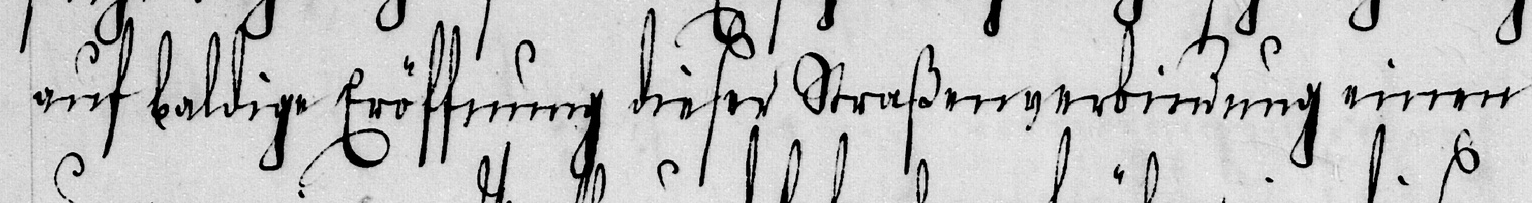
auf baldige Eröffnung dieser Straßenverbindung einen
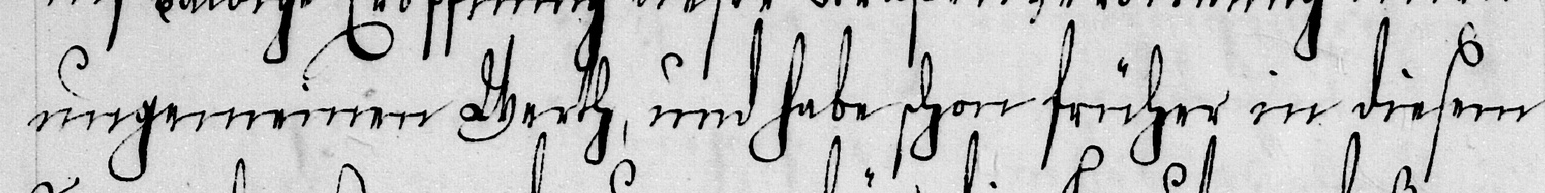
ungemeinen Werth, und habe schon früher in diesem
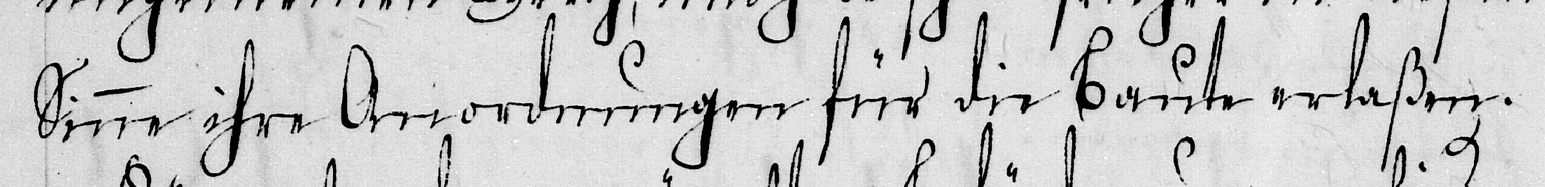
Sinne ihre Anordnungen für die Baute erlaßen.
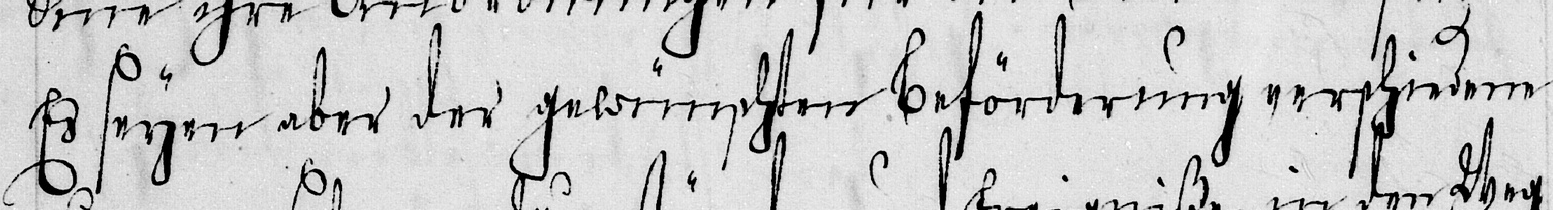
Es seyen aber der gewünschten Beförderung verschiedene
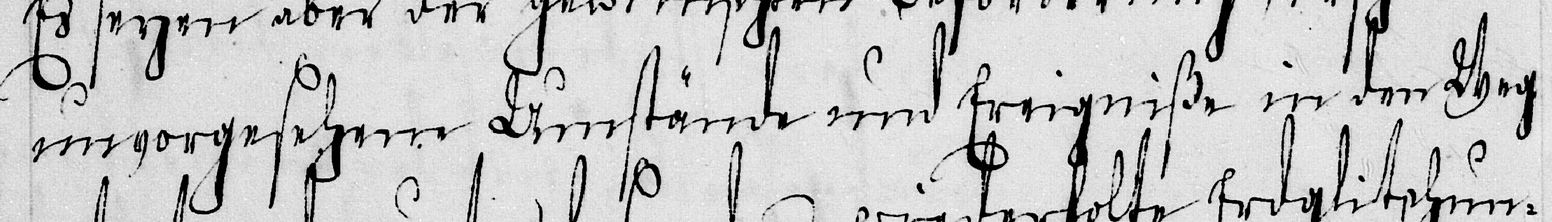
unvorgesehene Umstände und Ereigniße in den Weg
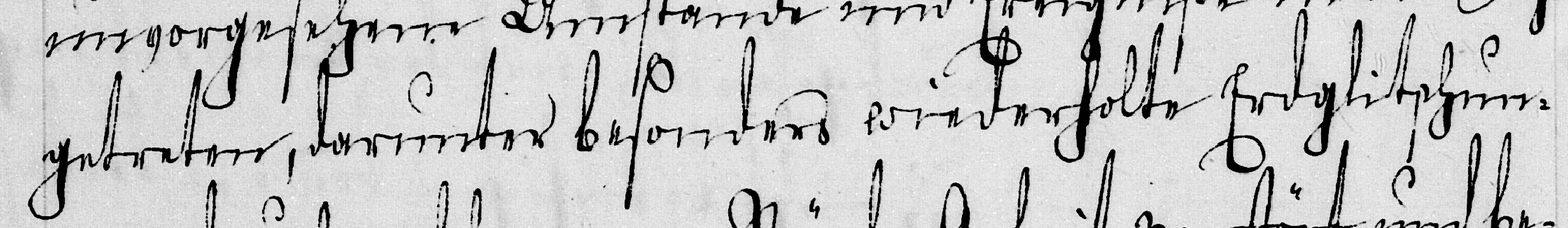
getreten, darunter besonders wiederholte Erdglitschun¬
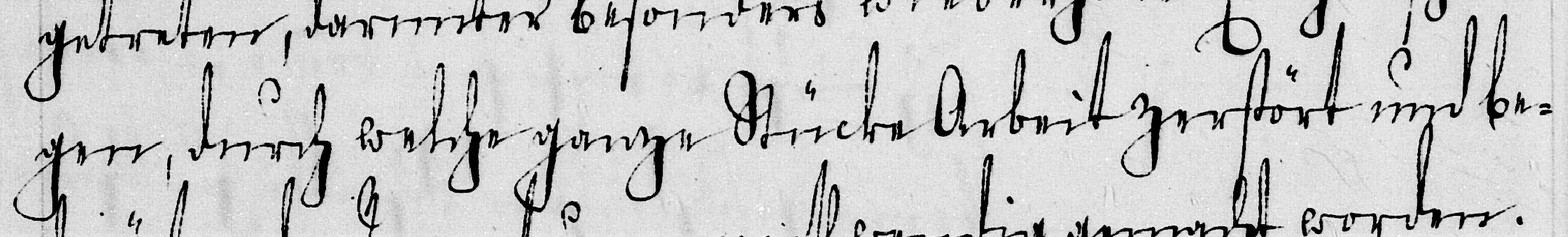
gen, durch welche ganze Stücke Arbeit zerstört und be¬
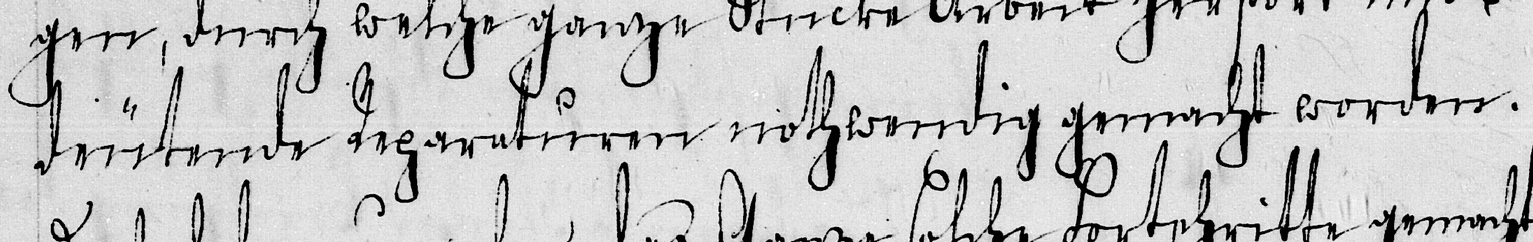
deutende Reparationen nothwendig gemacht worden.
